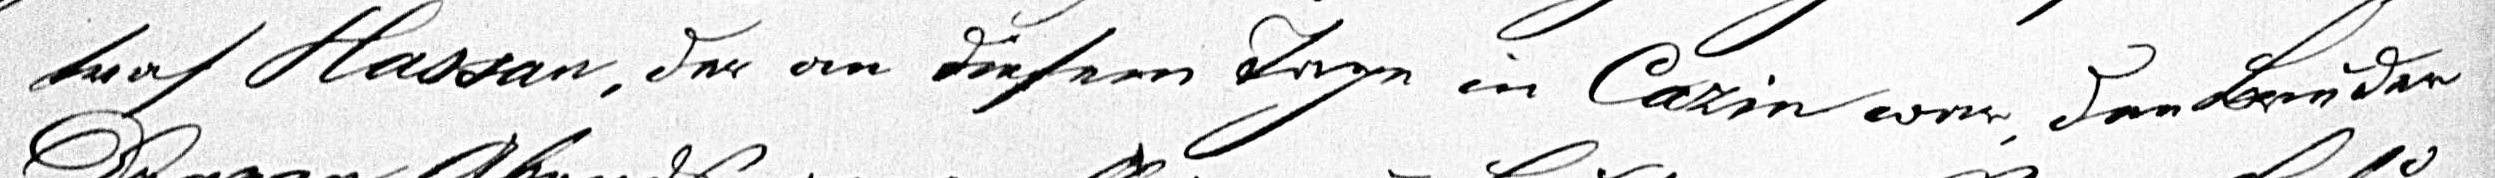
xx Hassan, der an diesem Tage in Cazin war, den Bruden
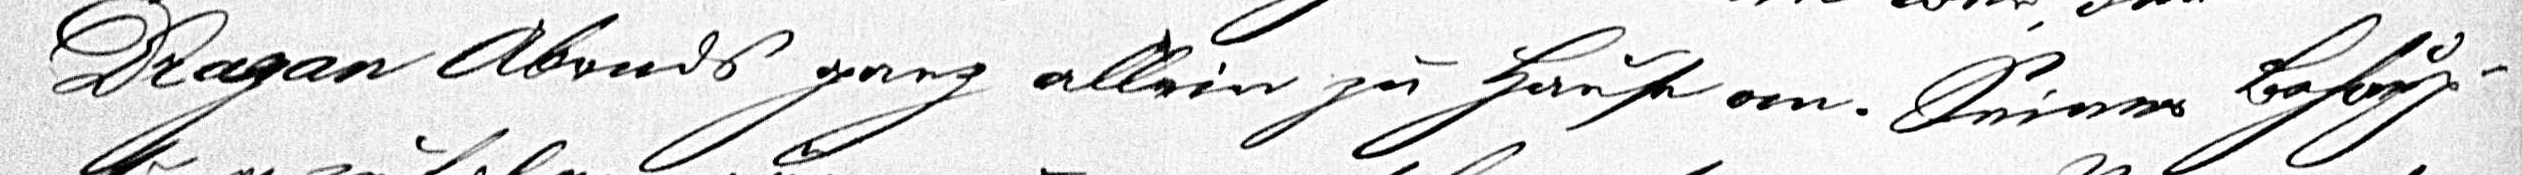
Dragan Abends ganz allein zu Hause an. Seiner Behaup¬
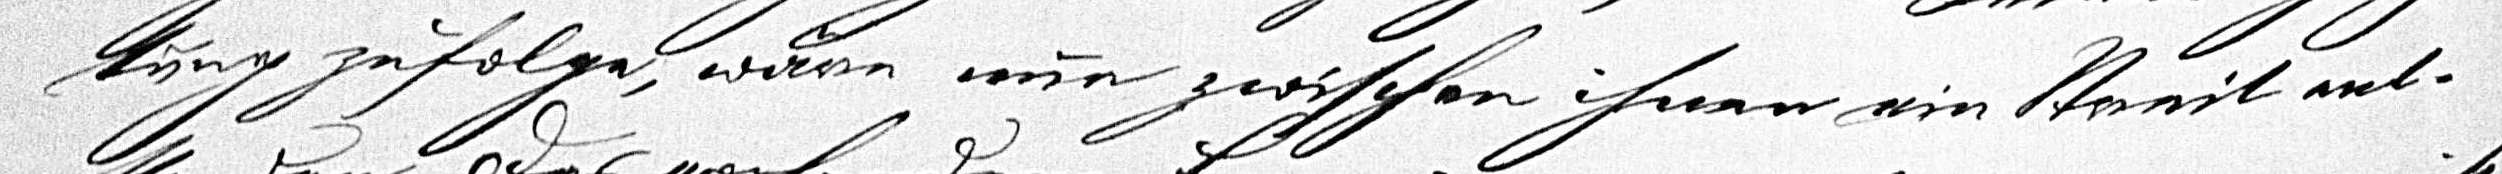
tung zufolge, wäre nun zwischen ihnen ein Streit ent¬
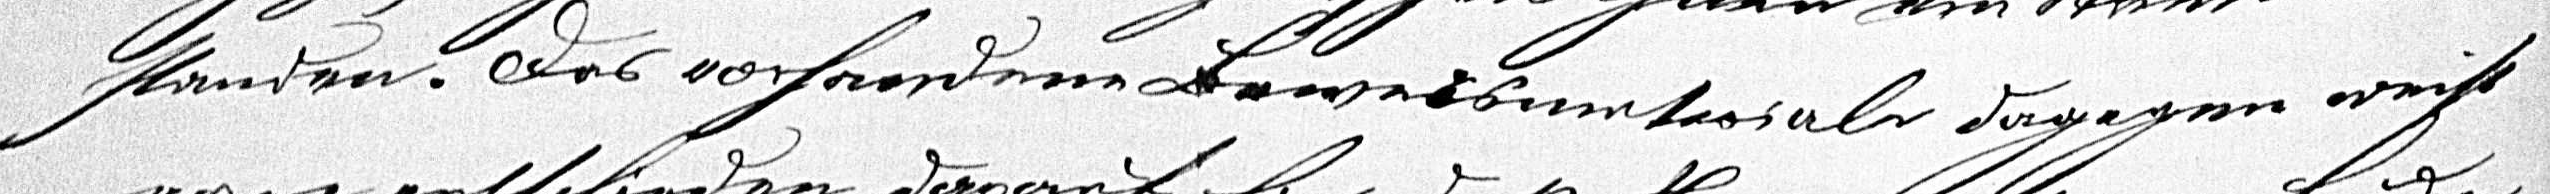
standen. Das vorhandene Beweismateriale dagegen weist
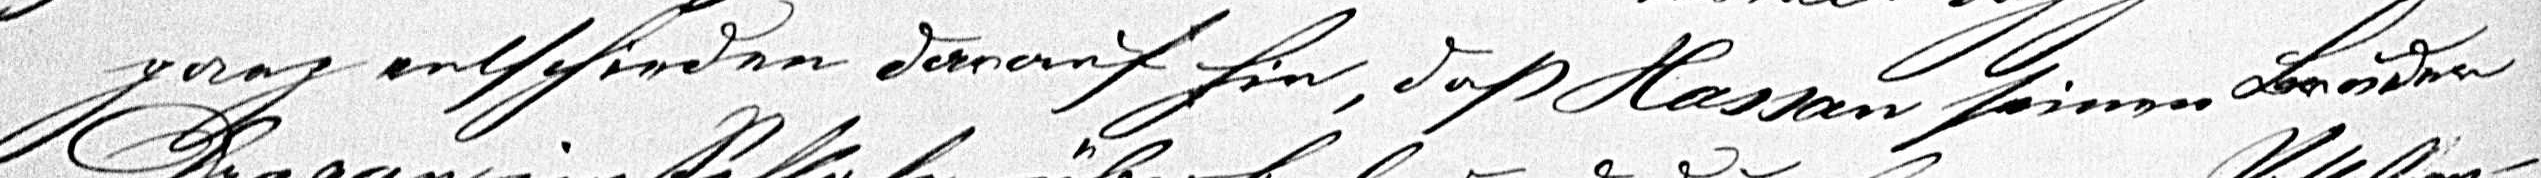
ganz entschieden darauf hin, daß Hassan seinen Bruder
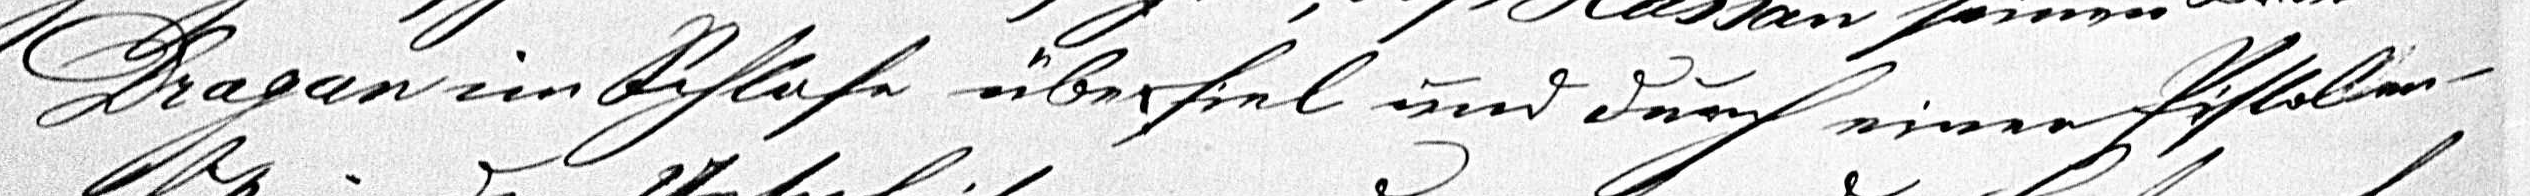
Dragan im Schlafe überfiel und durch einer Pistolen¬
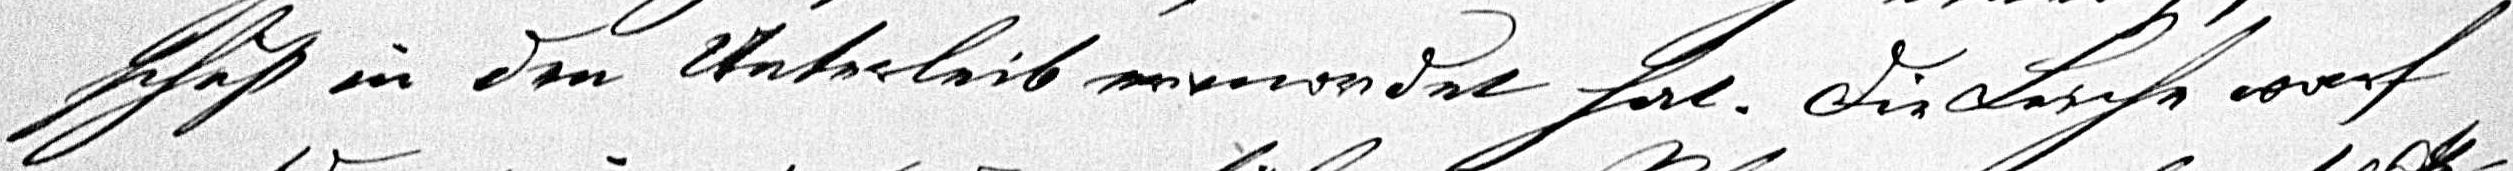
schuß in den Unterleib er mordet hat. Die Leiche warf
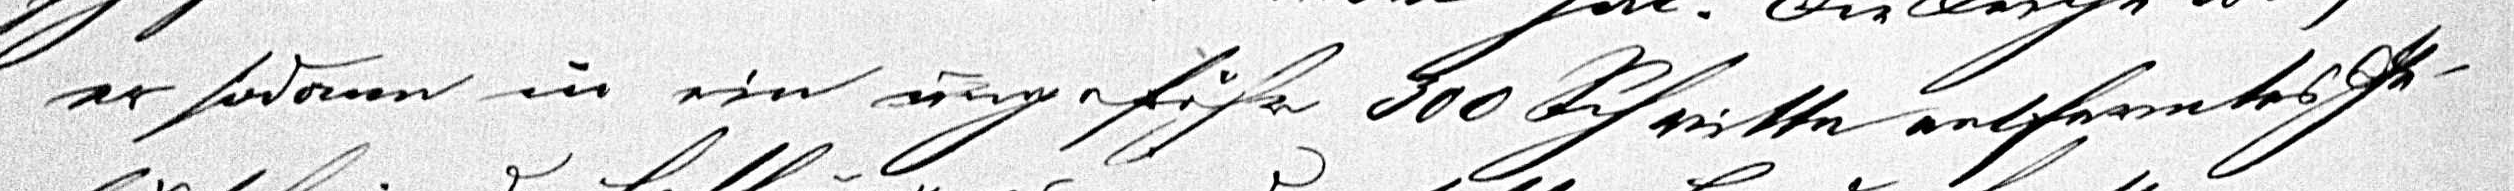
er sodann in ein ungefähr 300 Schritte entferntes Ge¬
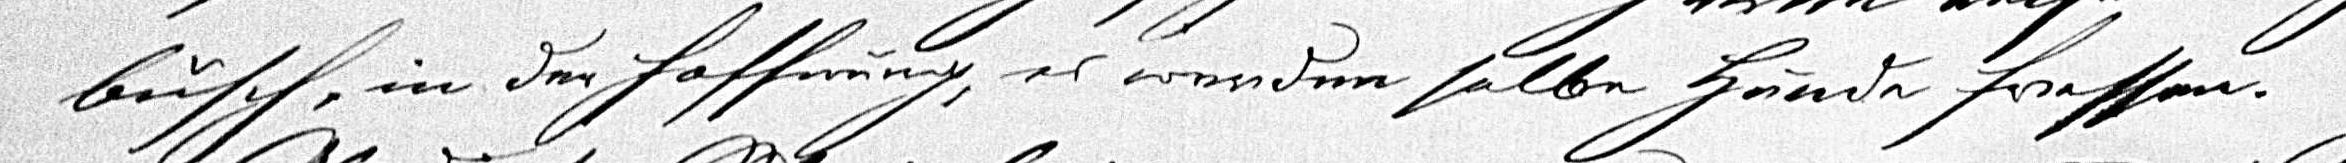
büsch, in der Hoffnung, er werden selbe Hunde fressen.
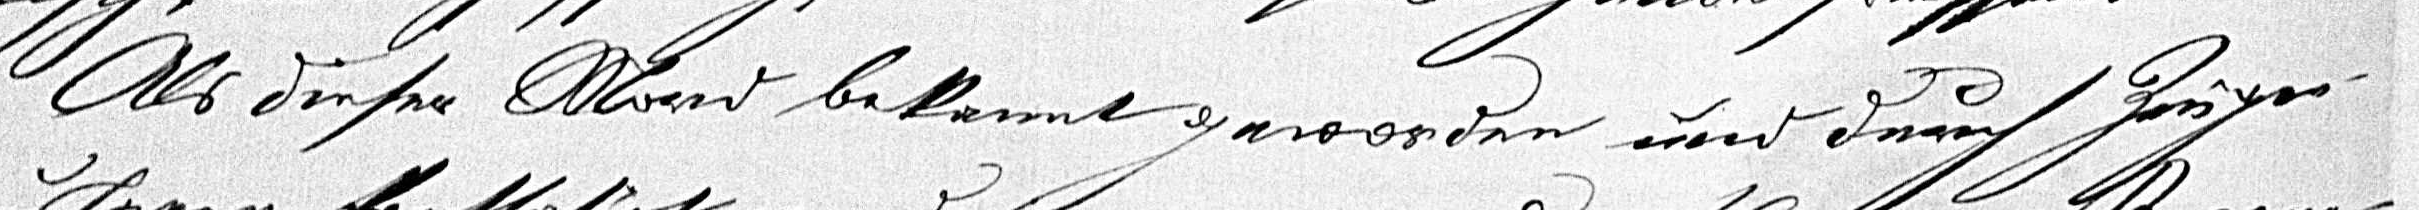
Als dieser Mord bekannt geworden und durch Zeugen¬
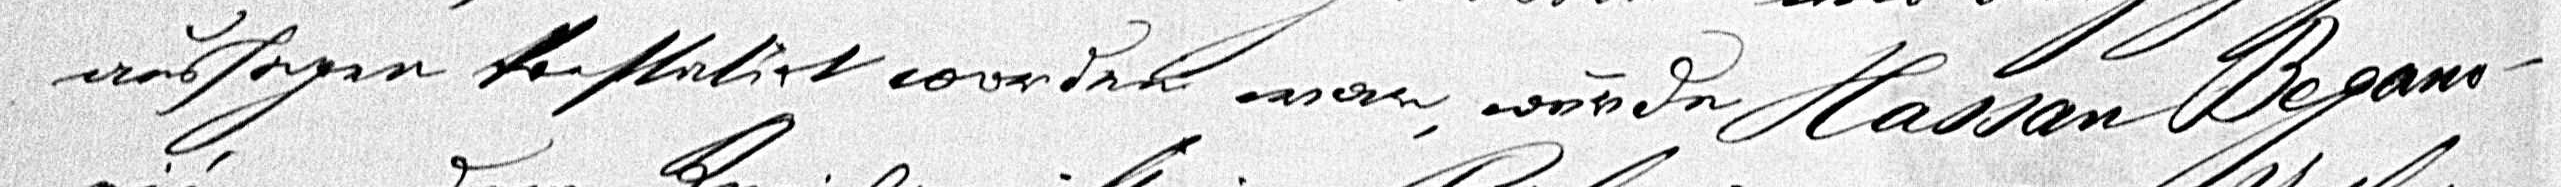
aussagen konstatirt worden war, wurde Hassan Begano¬
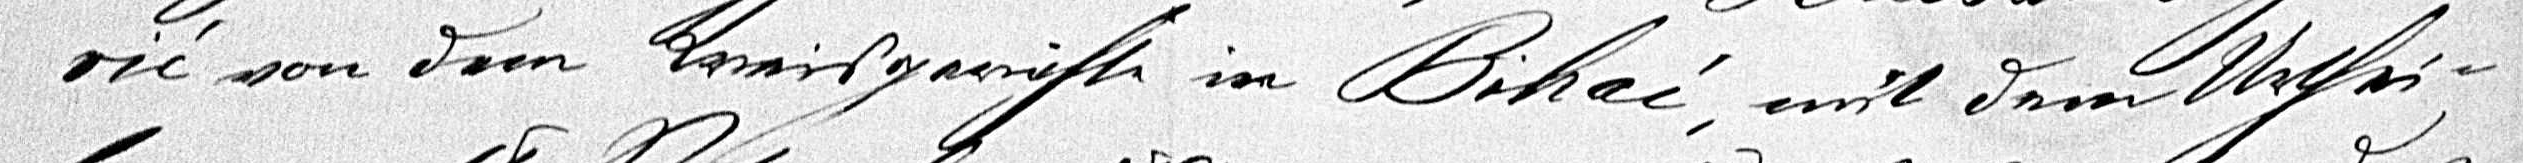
vić von dem Kreisgerichte in Bihać, mit dem Urtheil¬
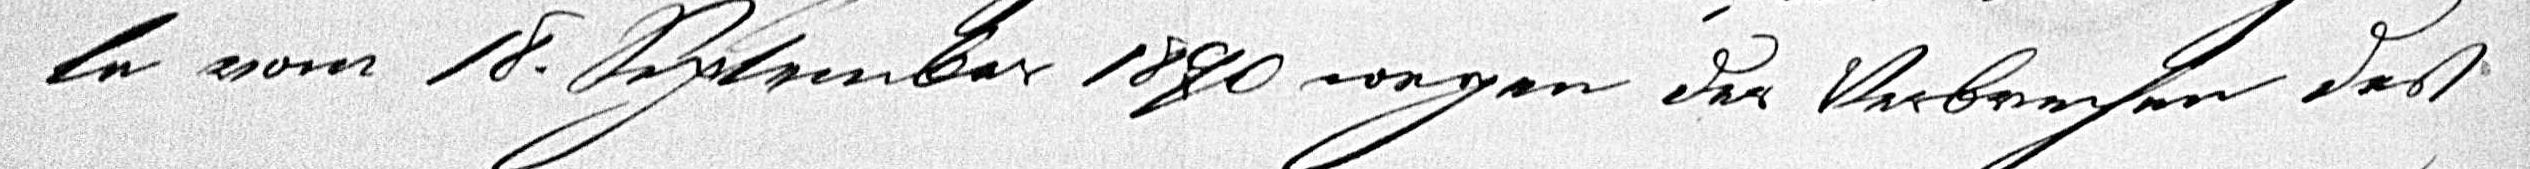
le vom 18. September 1890 wegender Verbrechen des
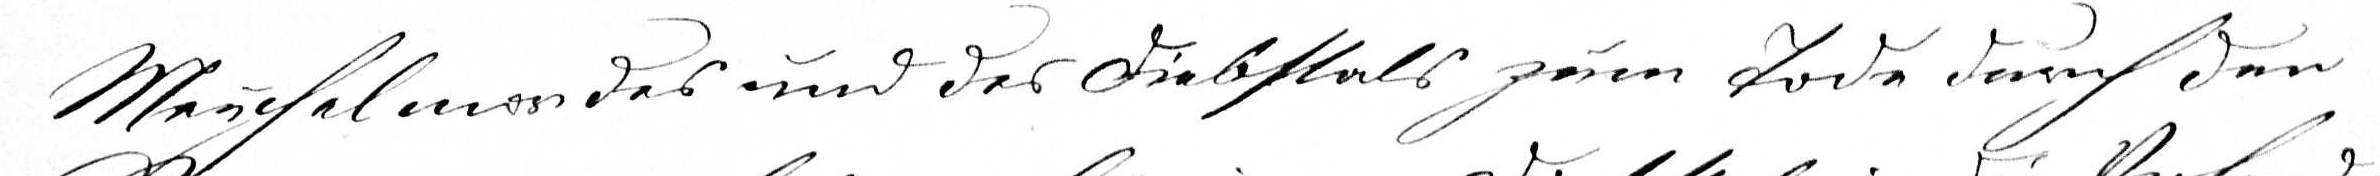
Meuchelmordes und des Diebstals zum Tode durch den
